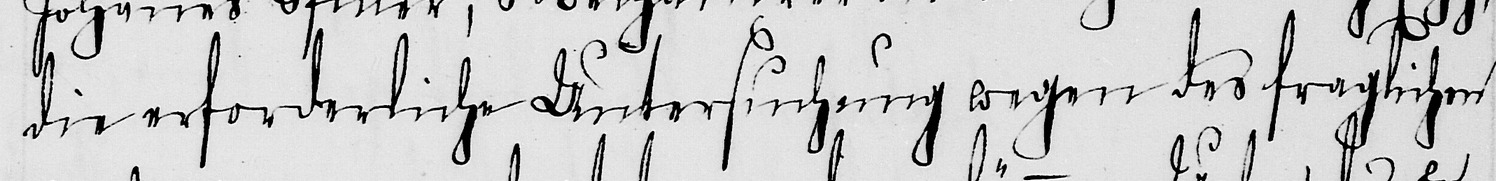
die erforderliche Untersuchung wegen des fraglichen
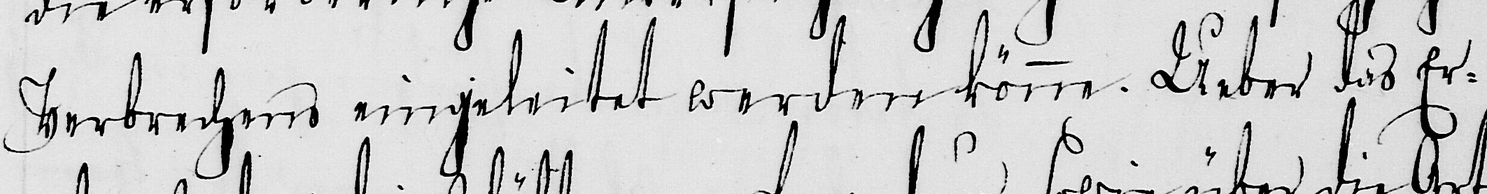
Verbrechens eingeleitet werden könne. Ueber das Er¬
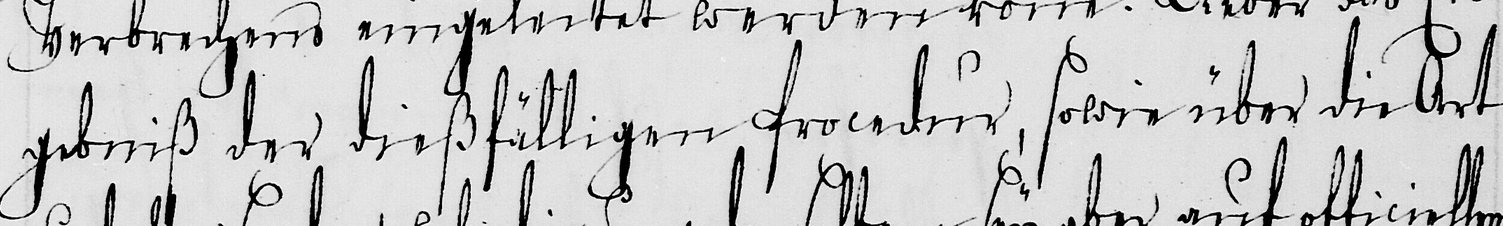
gebniß der dießfälligen Procedur, sowie über die Art
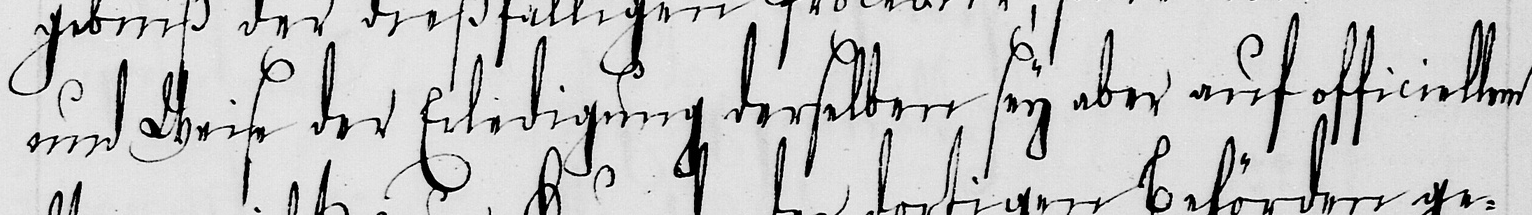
und Weise der Erledigung derselben sey aber auf officie¬
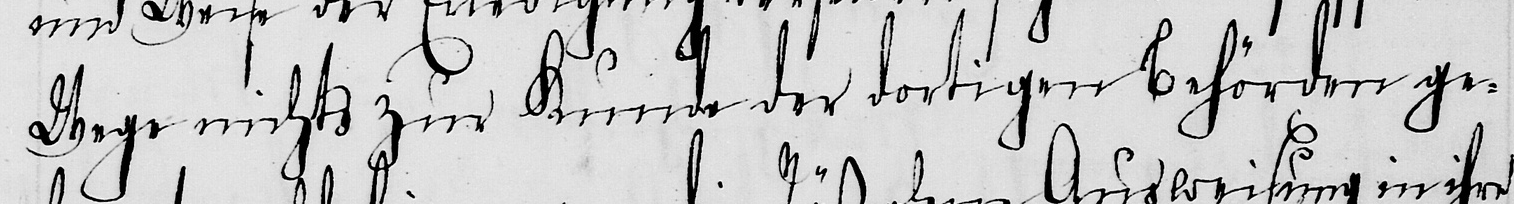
Wege nichts zur Kunde der dortigen Behörden ge¬
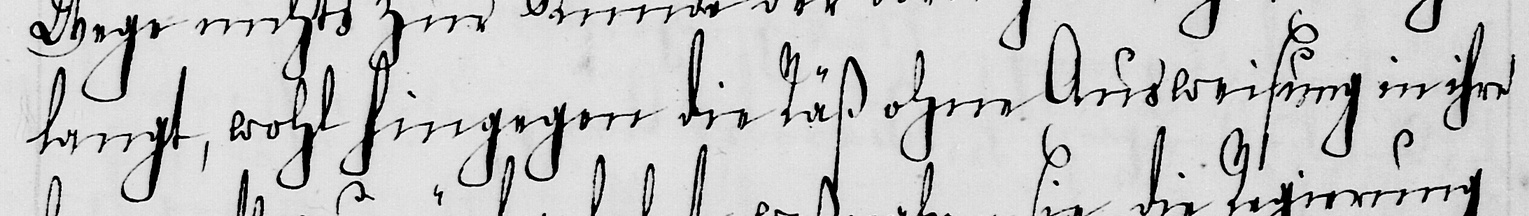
langt, wohl hingegen die Räß ohne Ausweisung in ihre
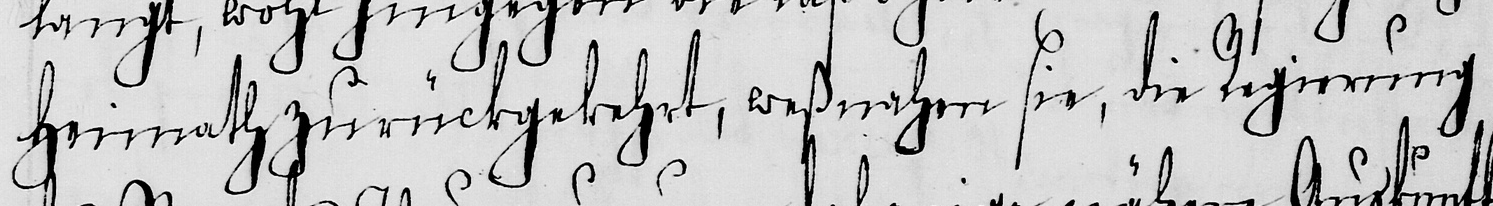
Heimath zurückgekehrt, weßnahen sie, die Regierung
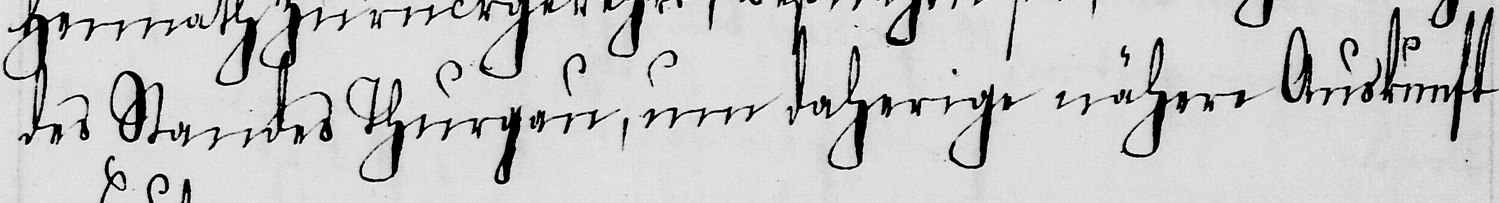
des Standes Thurgau, um daherige nähere Auskunft
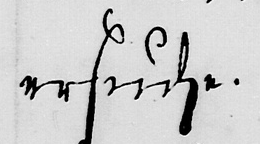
ersuche.
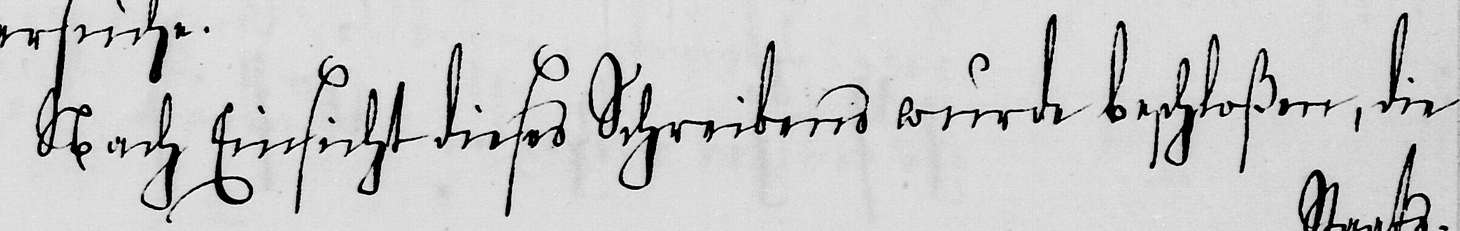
Nach Einsicht dieses Schreibens wurde beschloßen, die
